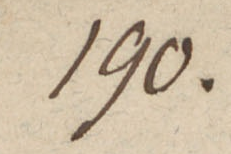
190.
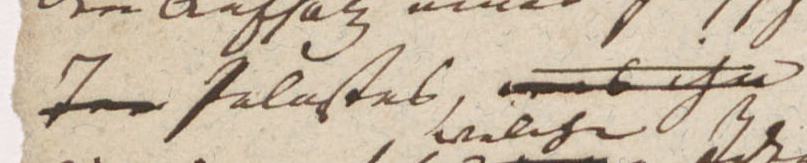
dem solium, % worauf der
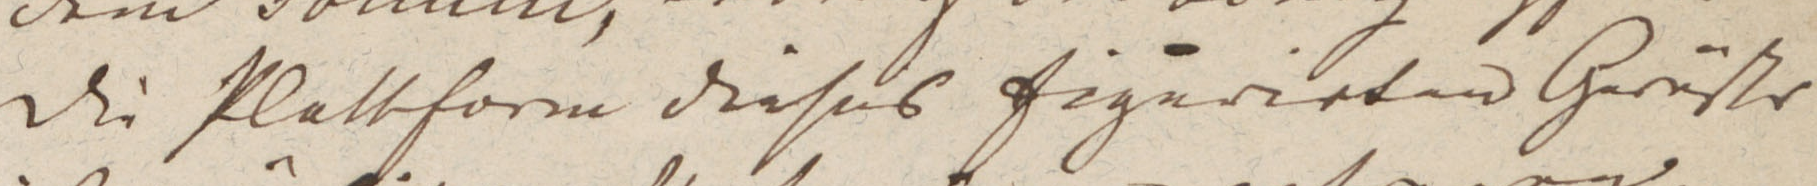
Die Plattform dieses figurirten Gerüsts
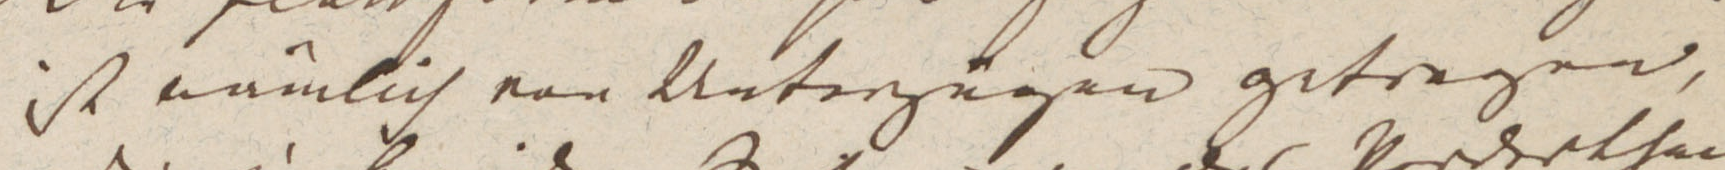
ist nämlich von Unterzügen getragen,
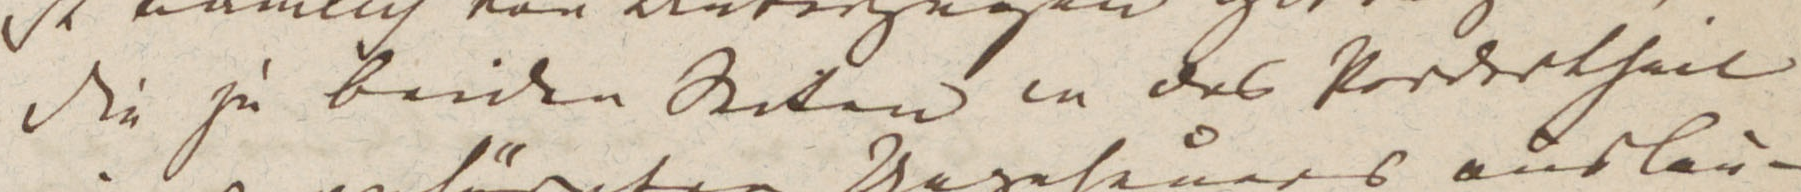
die zu beiden Seiten in das Vordertheil
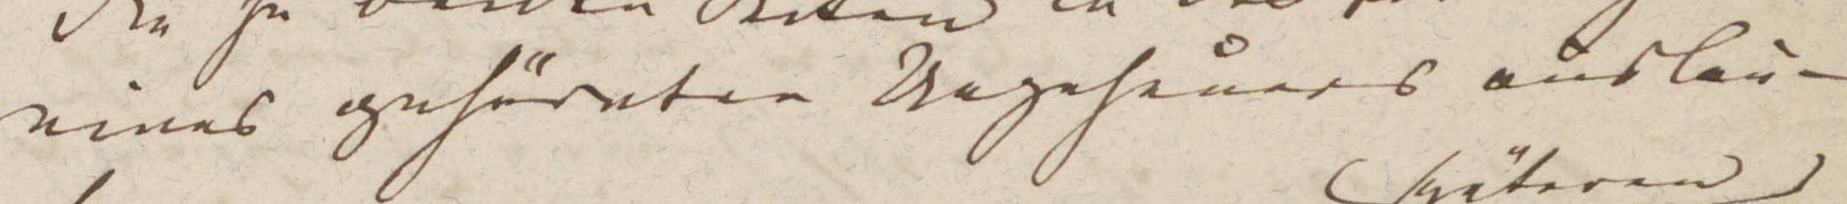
eines gehörnten Ungeheuers auslau-
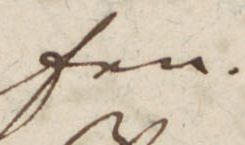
Ideen
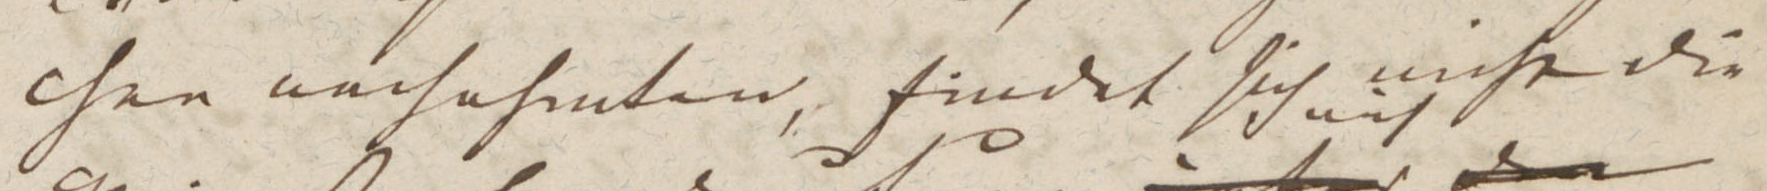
chen nachahmten, findet sich nicht die
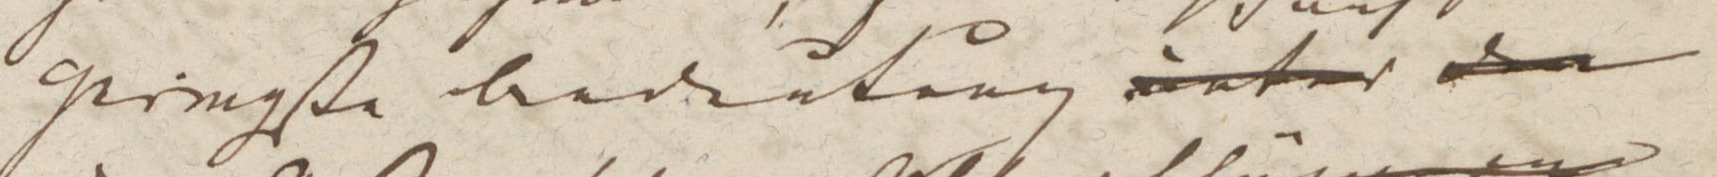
geringste Andeutung unter auf den
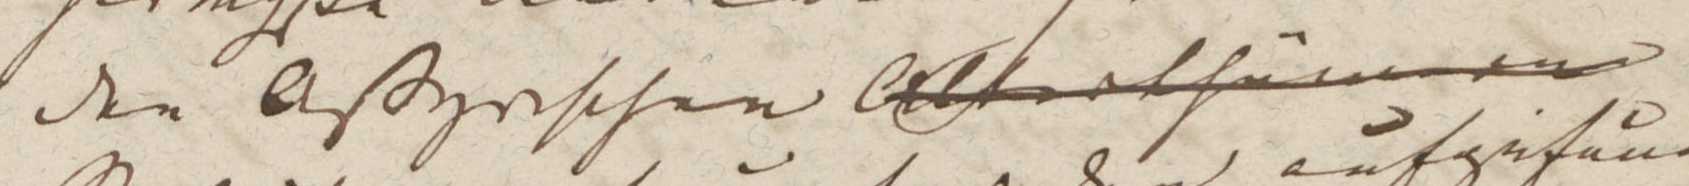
den Assyrischen Alterthümern
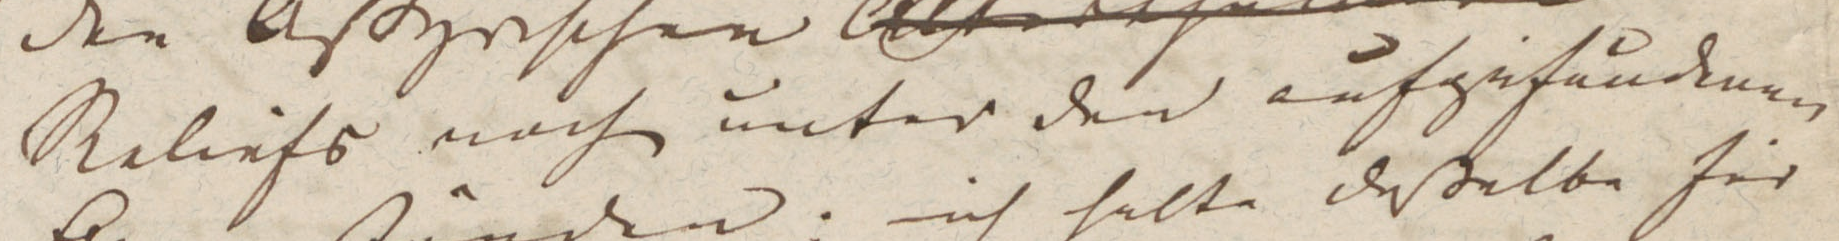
Reliefs noch unter den aufgefundenen
